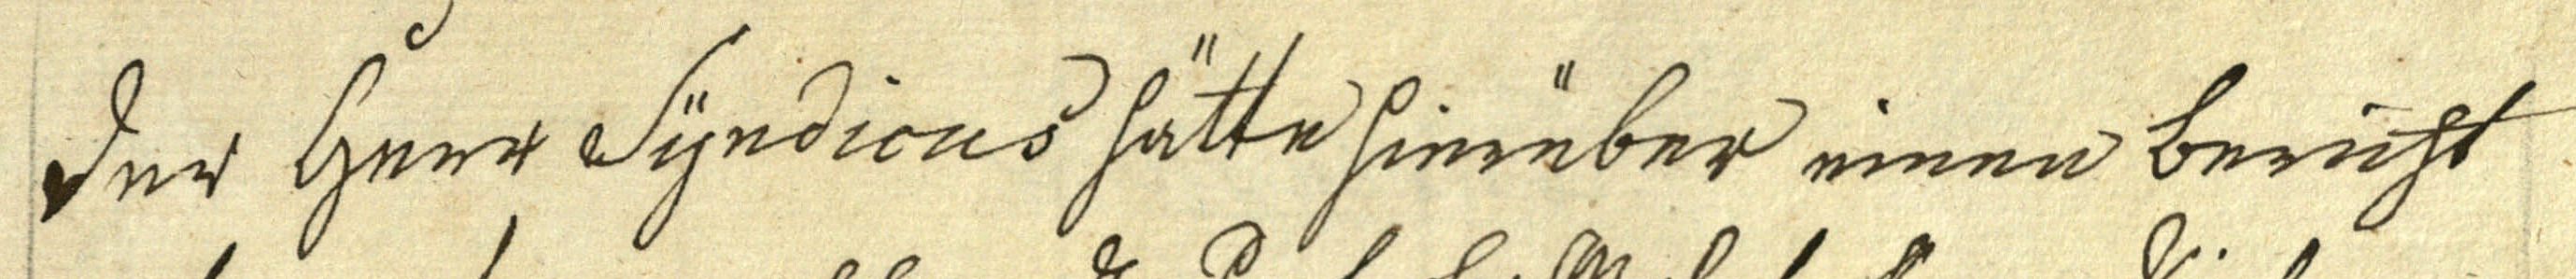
Der Herr Sÿndicus hätte hierüber einen Bericht
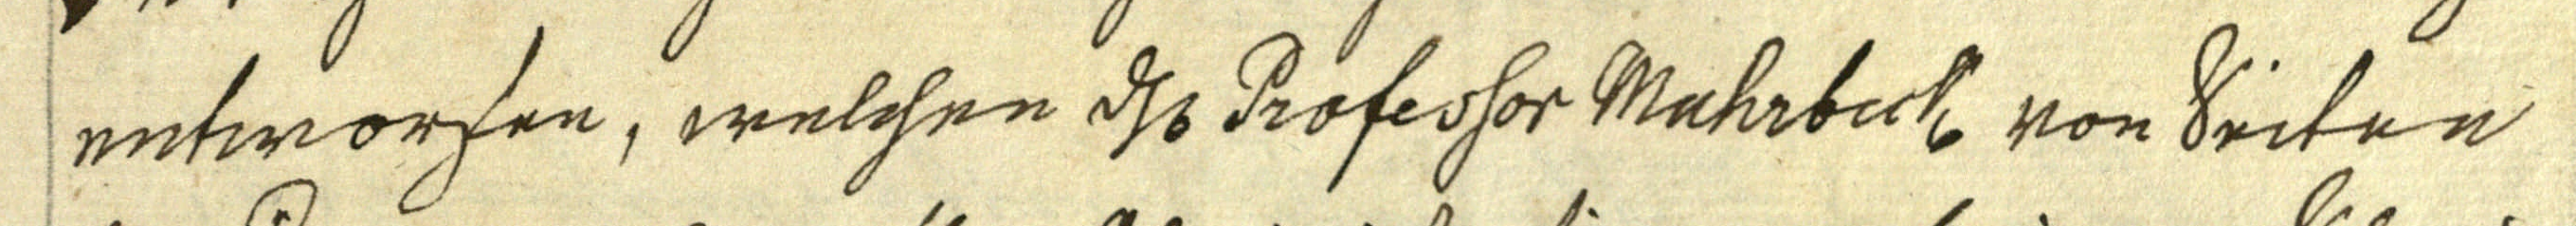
entworfen, welchen dh Professor Muhrbeck von Seiten
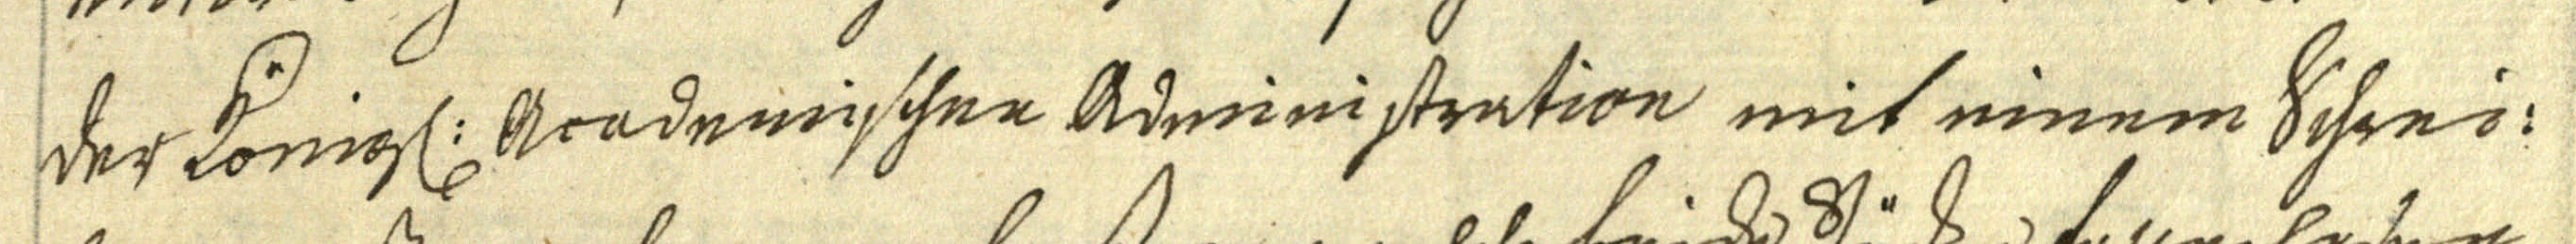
der Königl. Academischen Administration mit einem Schrei¬
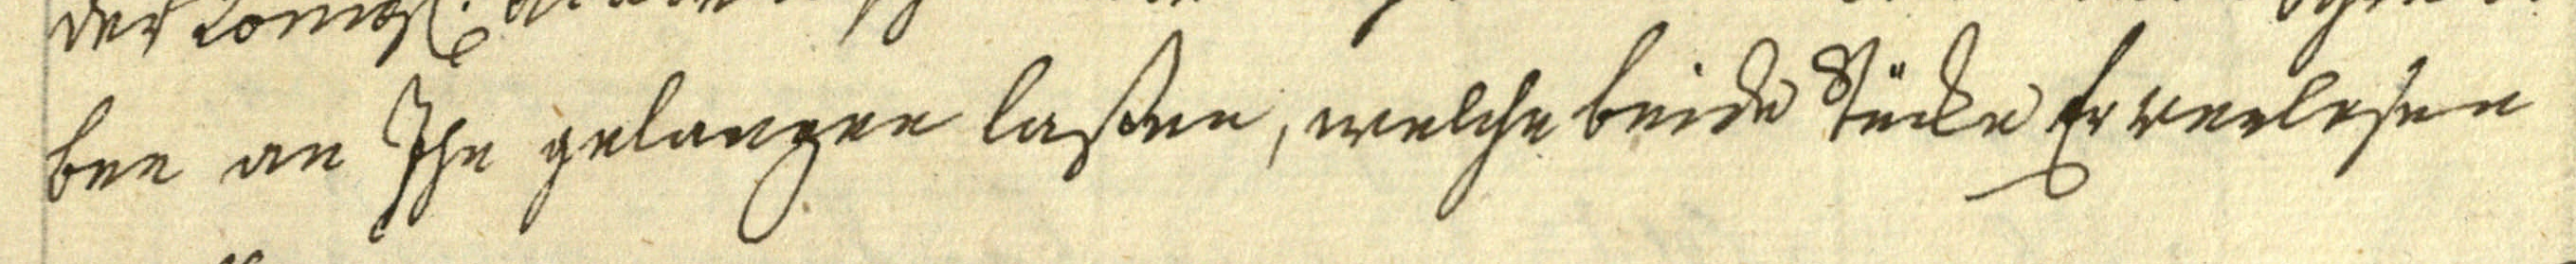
ben an Ihn gelangen laßen, welche beide Stücke Er verlesen
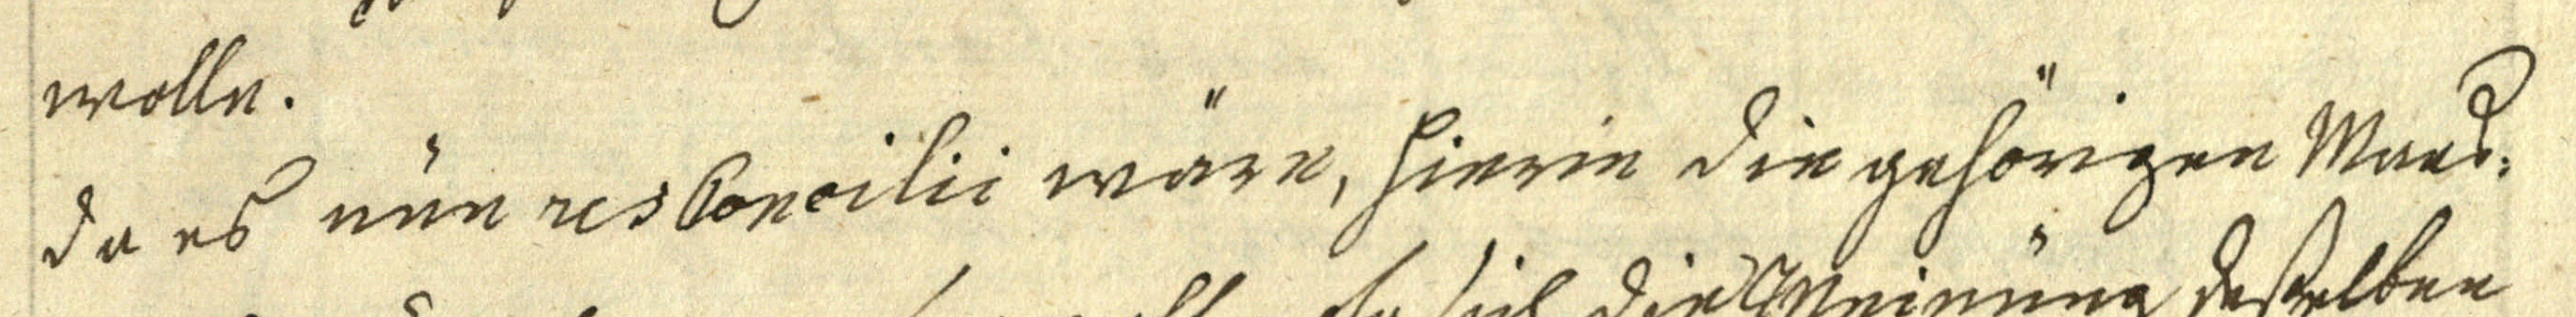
Da es nun res Concilii wäre, hierin die gehörigen Maas¬
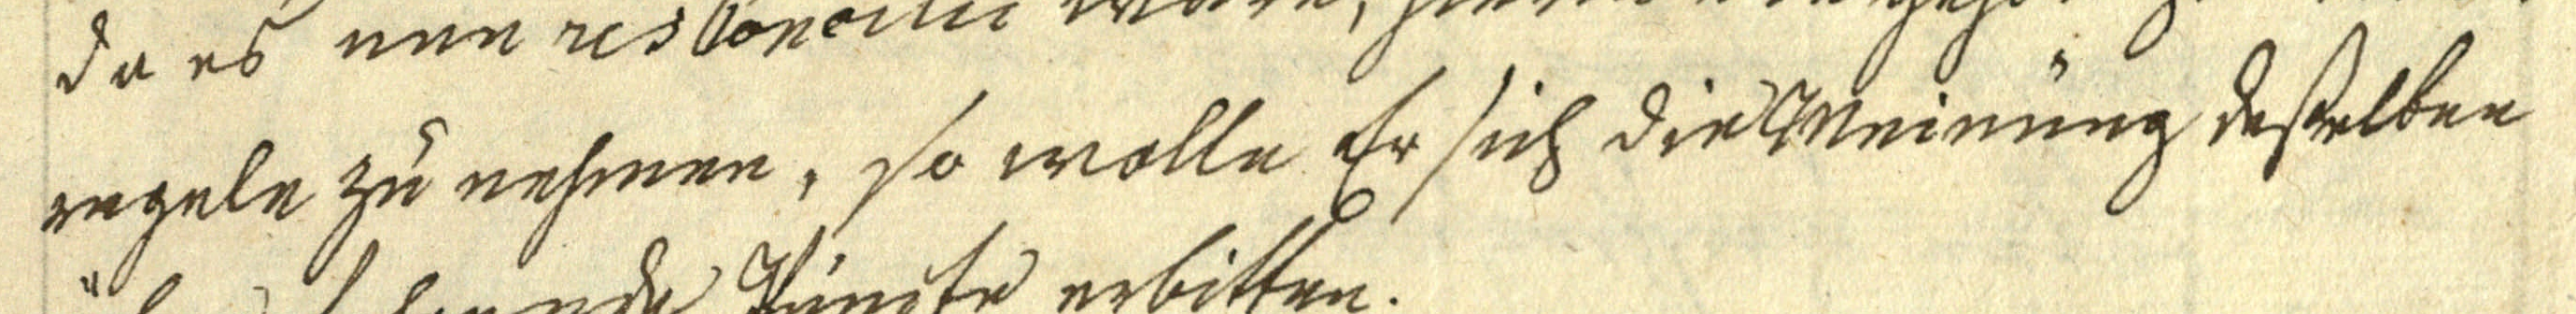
regeln zu nehmen, so wolle Er sich die Meinung deßelben
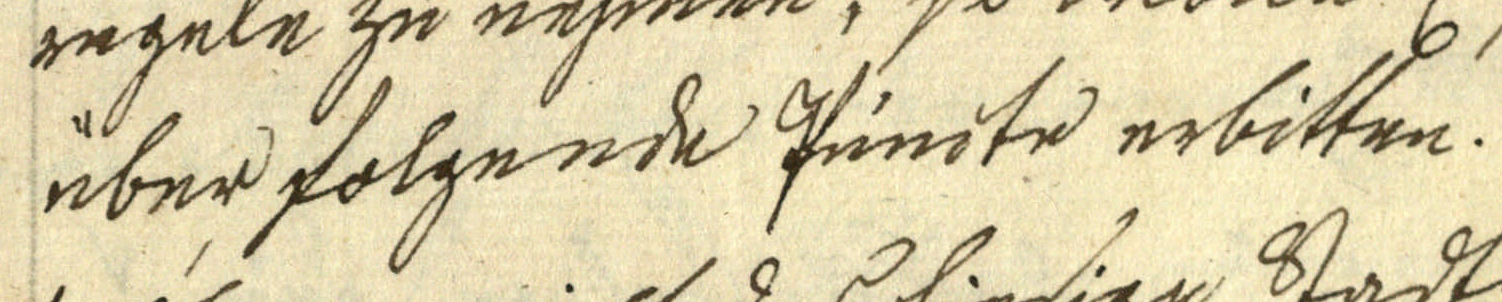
über folgende Puncte erbitten.
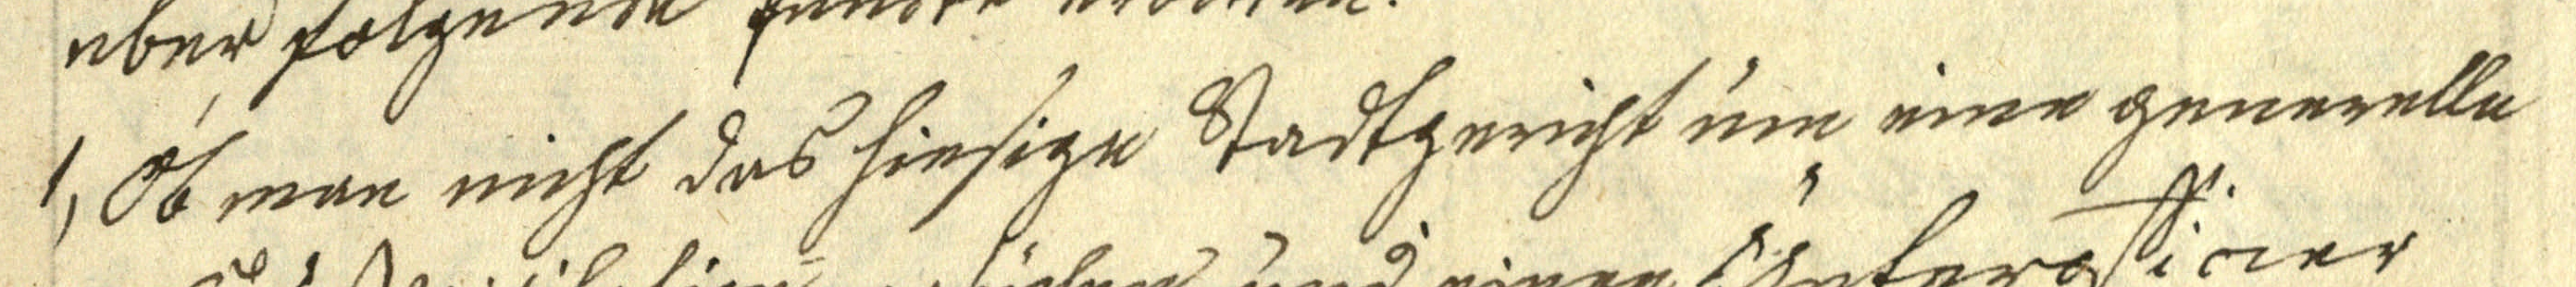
1, Ob man nicht das hiesige Stadtgericht um eine generelle
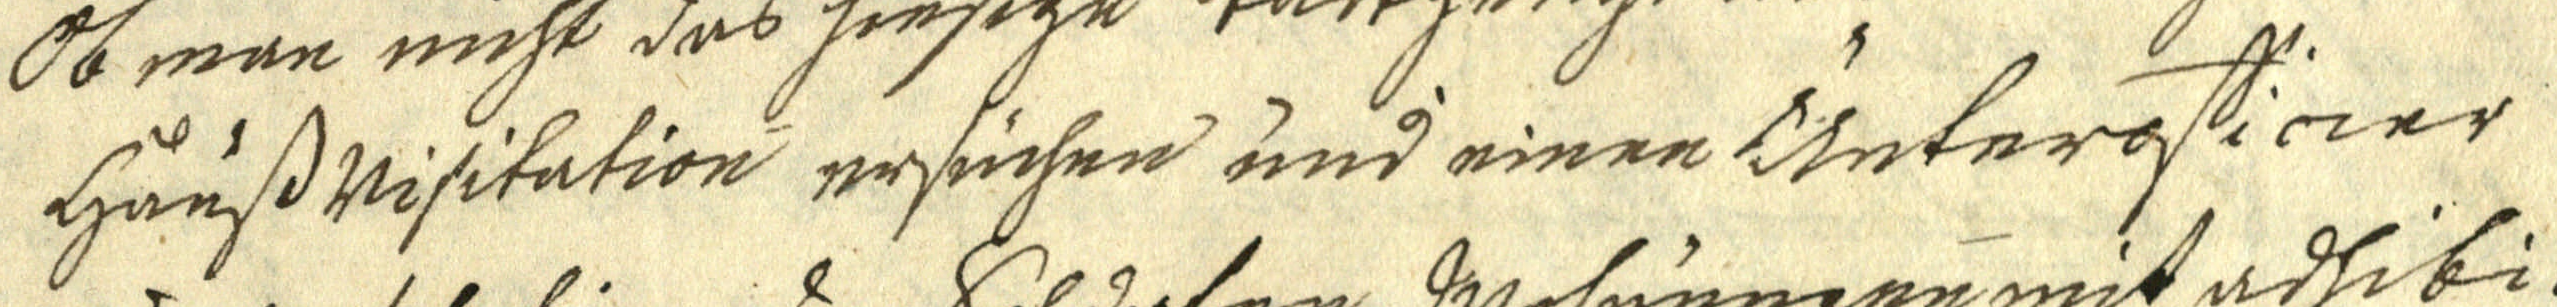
Hauß Visitation ersuchen und einen Unterofficier
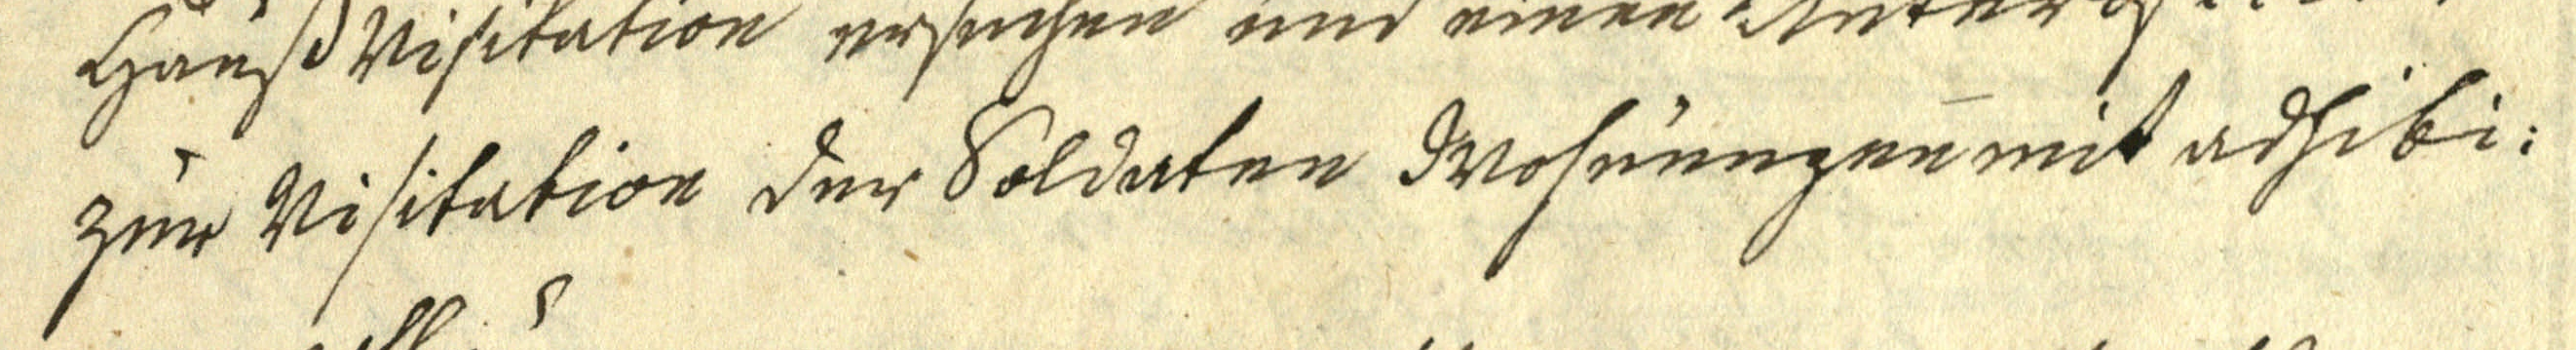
zur Visitation der Soldaten Wohnungen mit adhibi¬
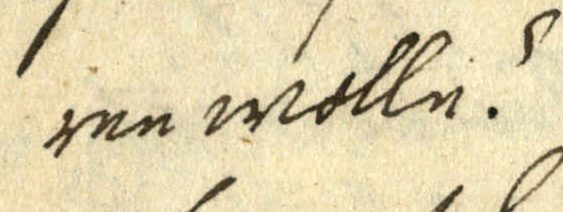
ren wolle?
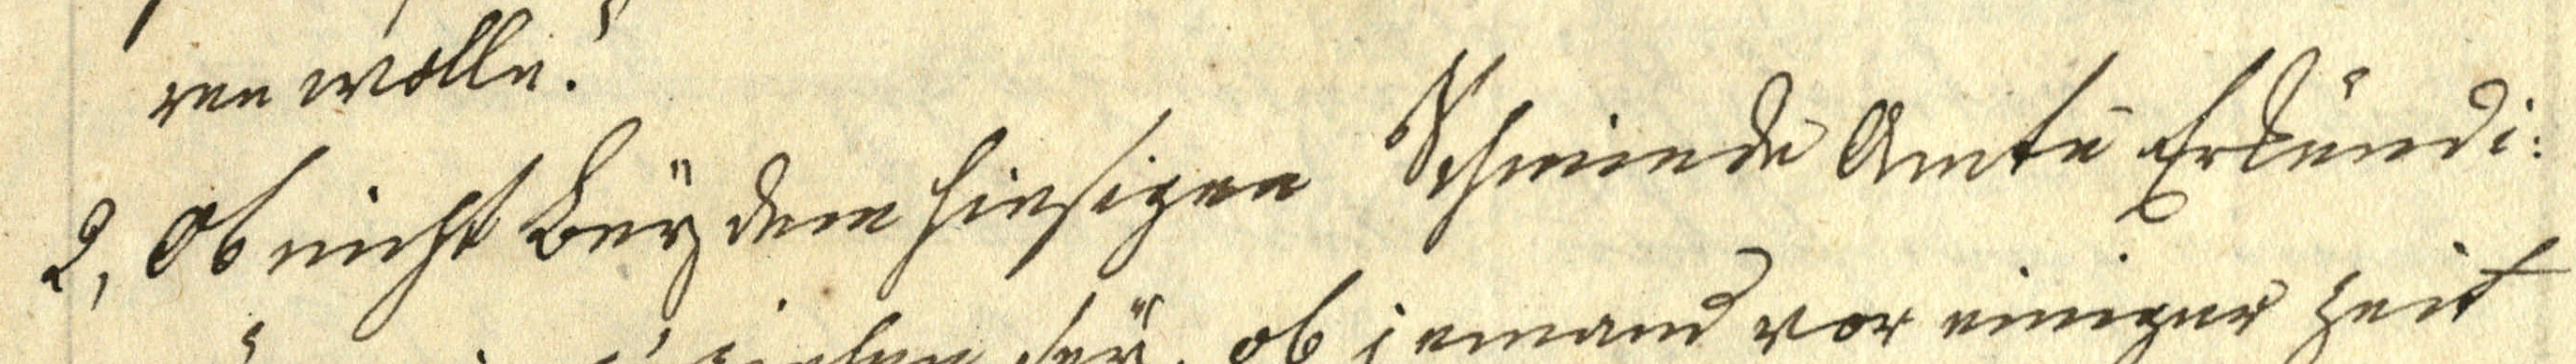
2. Ob nicht beÿ dem hiesigen Schmiede Amte Erkund¬
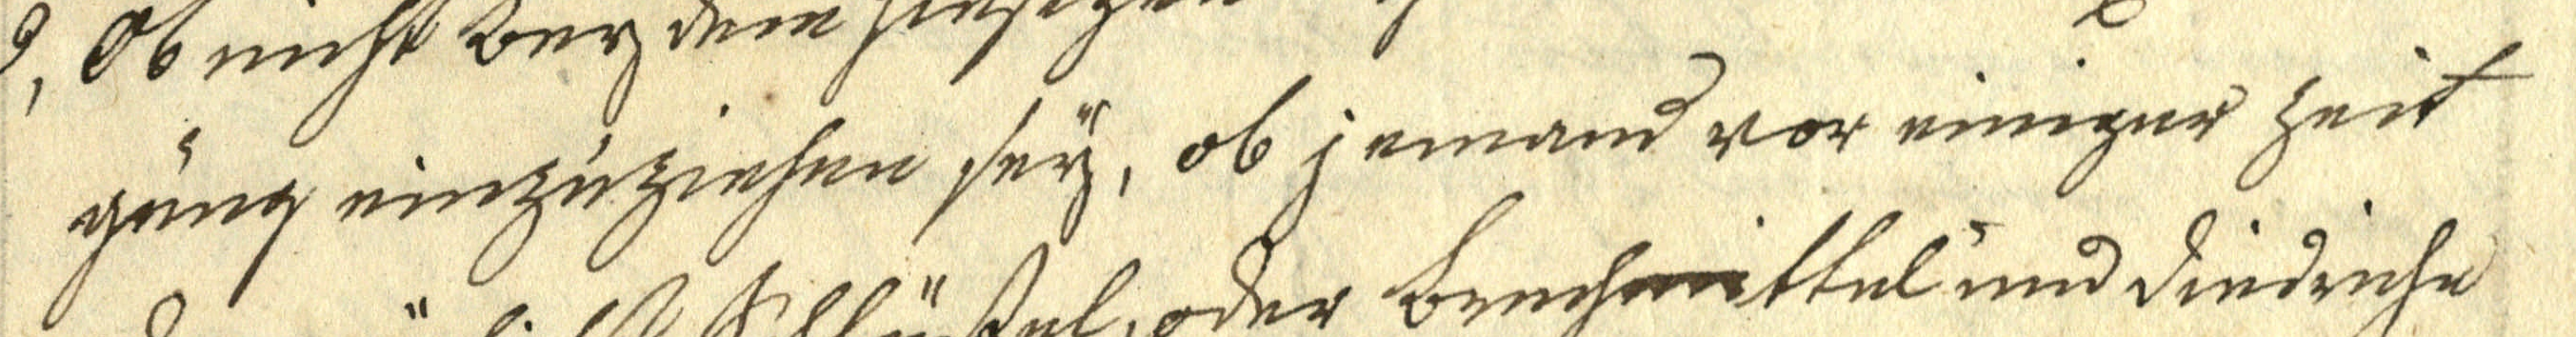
gung einzuziehen seÿ, ob jemand vor einiger Zeit
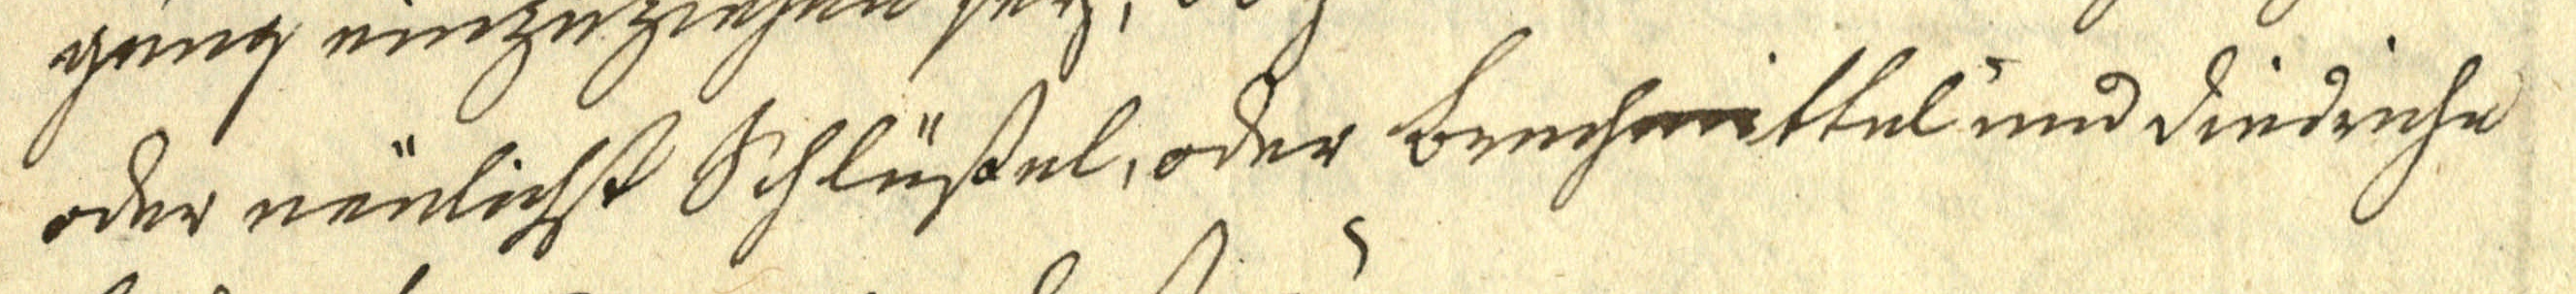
oder neulichst Schlüßel, oder Brechmittel und Diedriche
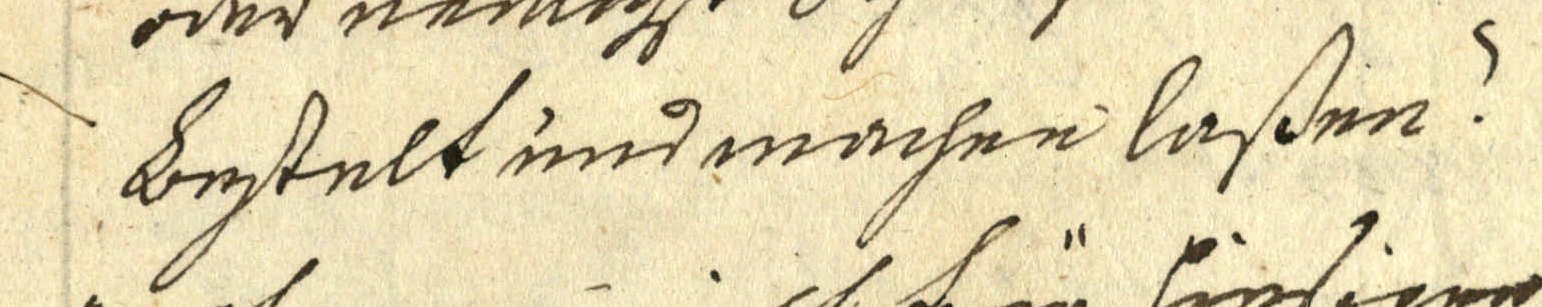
bestellt und machen laßen?
